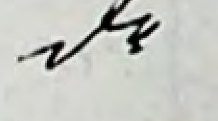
do
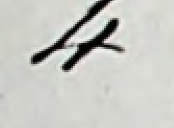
4
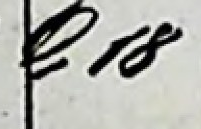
0,18
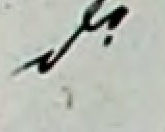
do
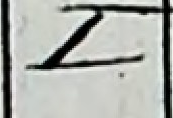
I
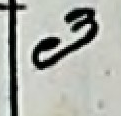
3
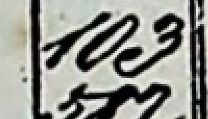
103
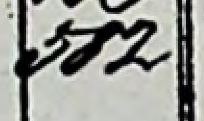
582
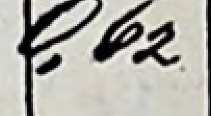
0,62
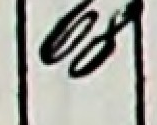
68
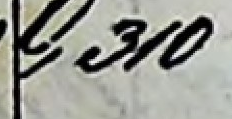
0,310
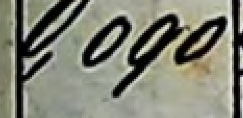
0,090
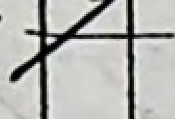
7
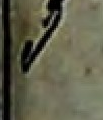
3
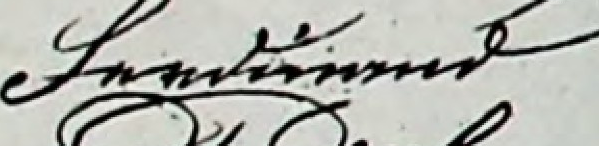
Ferdinand
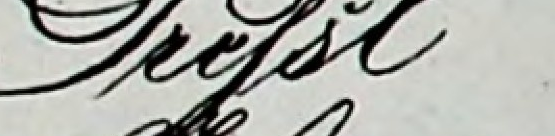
Pressl
